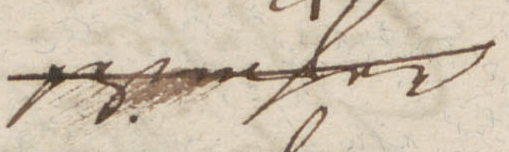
aber Willensäusserung.
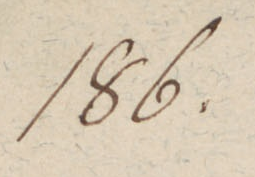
186.
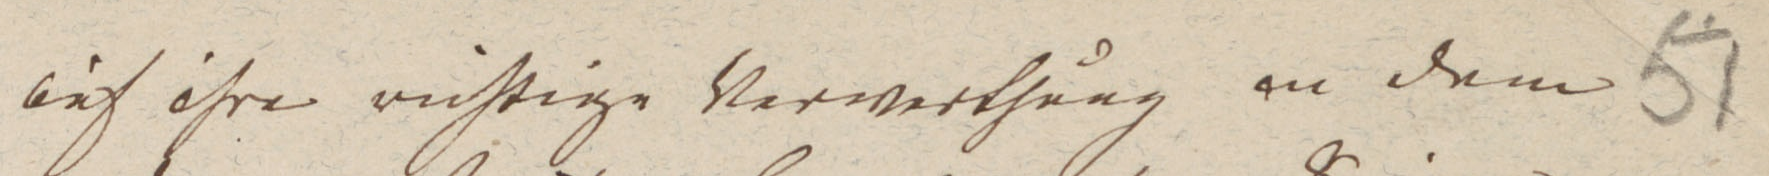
auf ihre richtige Verwerthung in dem
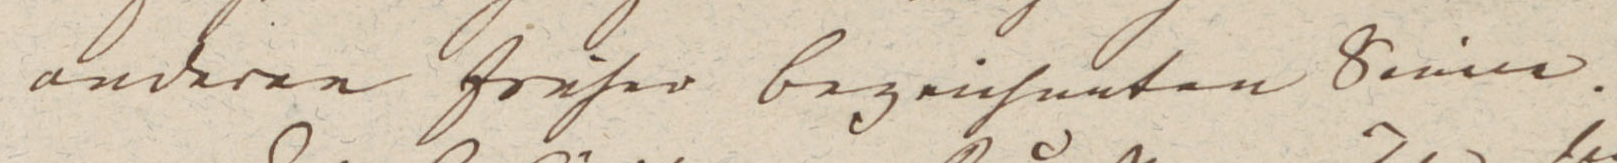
anderen früher bezeichneten Sinne.
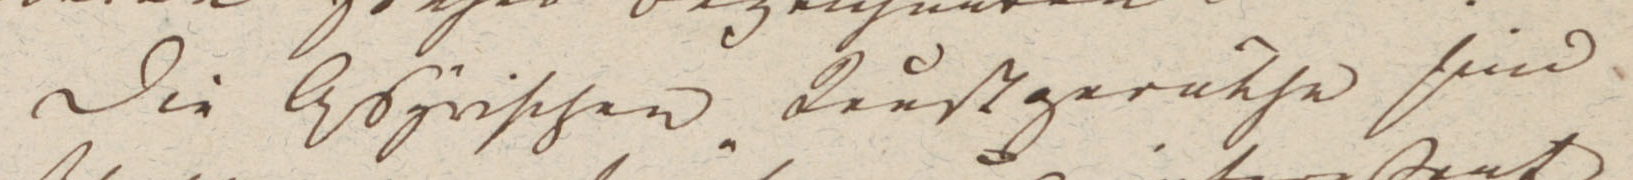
Die Assyrischen Kunstgeräthe sind
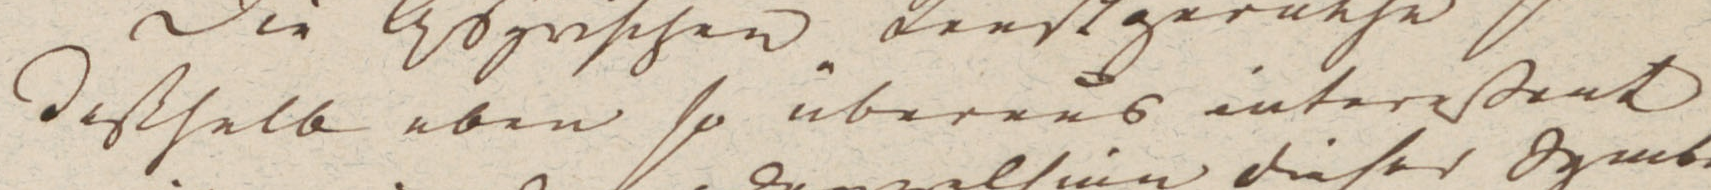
desshalb eben so überaus interessant
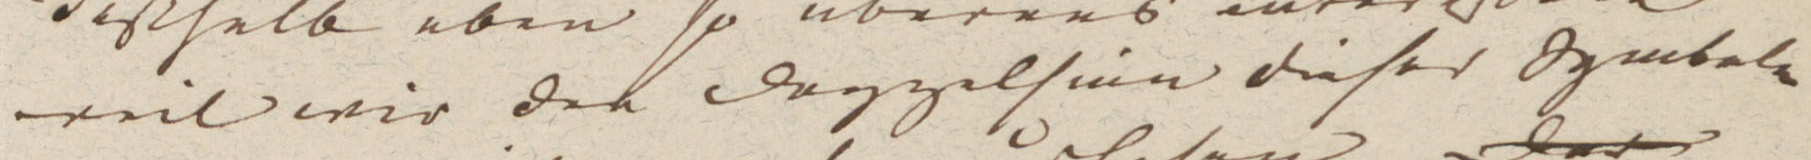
weil wir den Doppelsinn dieser Symbole
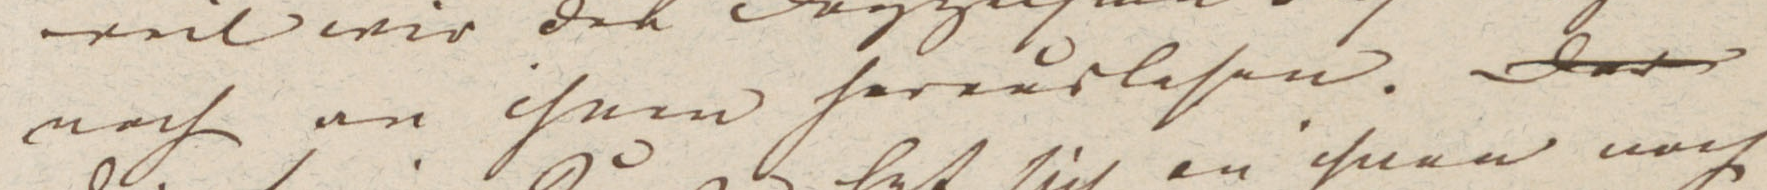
noch an ihnen herauslesen. Der
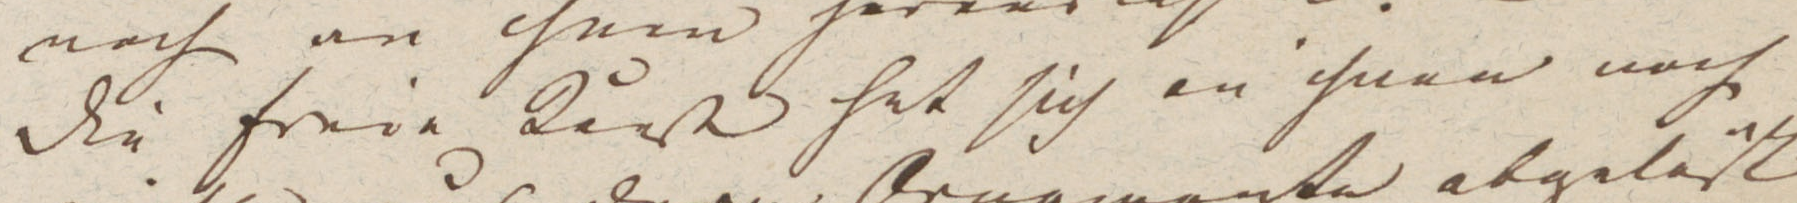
Die freie Kunst hat sich an ihnen noch
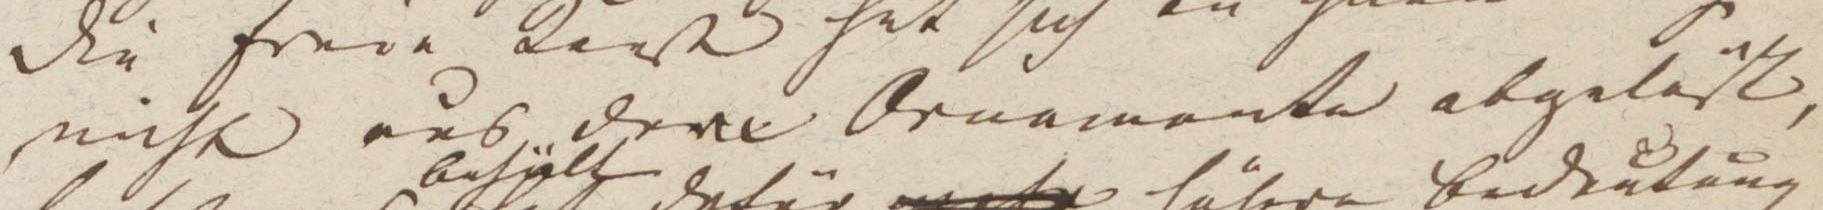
nicht aus derm Ornamente abgelöst,
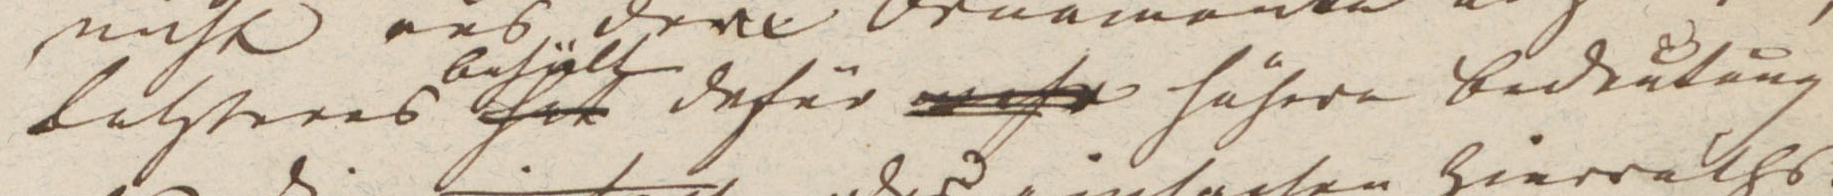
letzteres hat behält dafür mehr höhere Bedeutung
